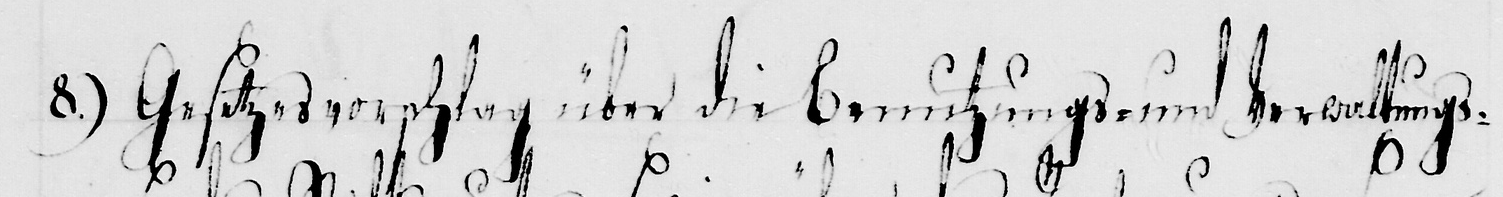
8.) Gesetzesvorschlag über die Benutzungs- und Verwaltungs¬
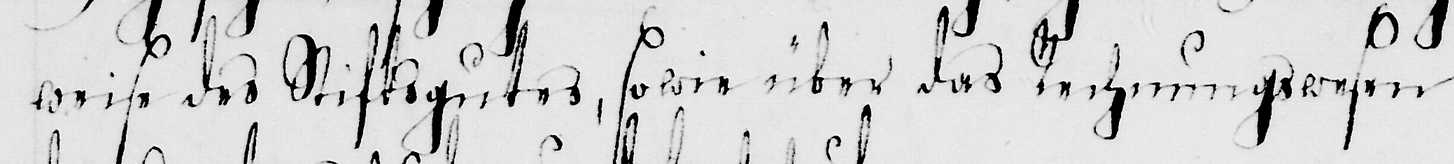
weise des Stiftsgutes, sowie über das Rechnungswesen
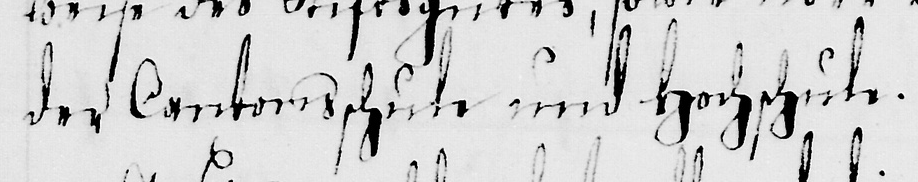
der Cantonsschule und Hochschule.
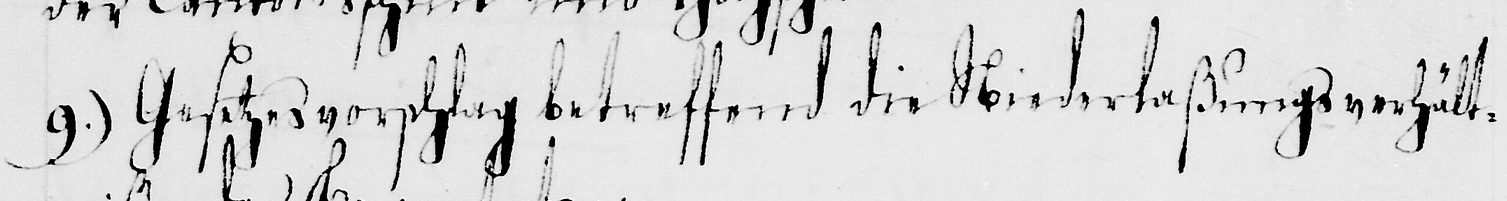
9.) Gesetzesvorschlag betreffend die Niederlaßungsverhält¬
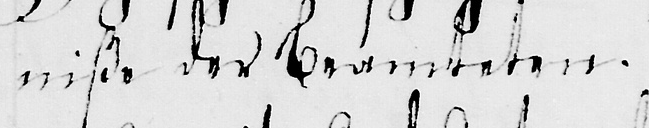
niße der Beamteten.
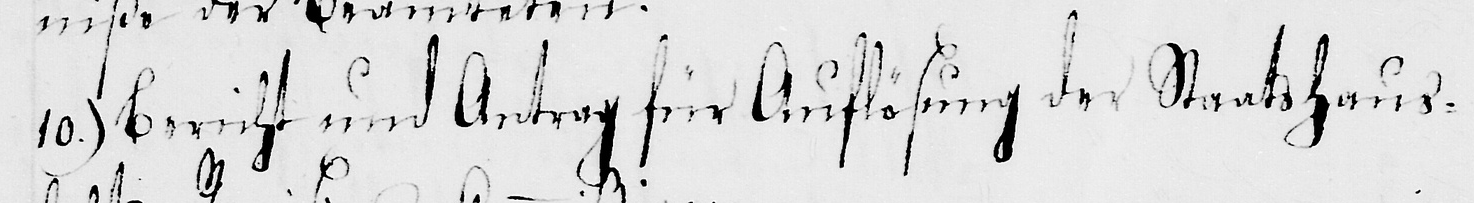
10.) Bericht und Antrag für Auflösung der Staatshaus¬
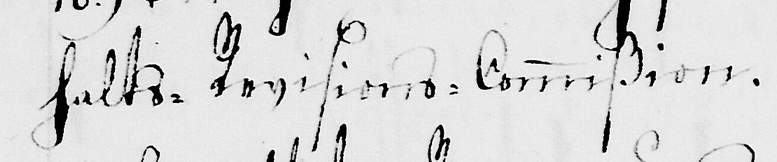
halts-Revisions-Commißion.
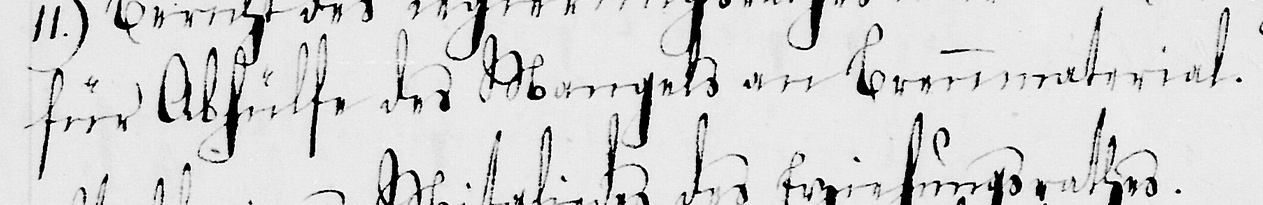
für Abhülfe des Mangels an Brennmaterial.
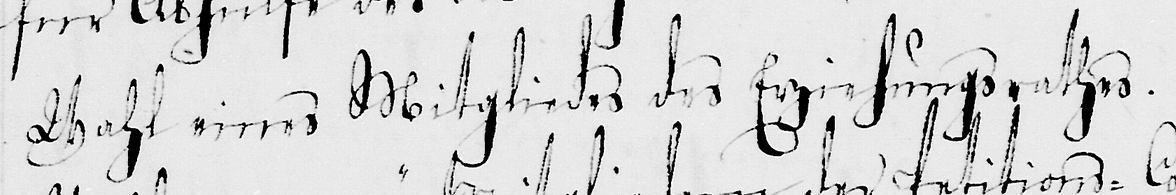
Wahl eines Mitgliedes des Erziehungsrathes.
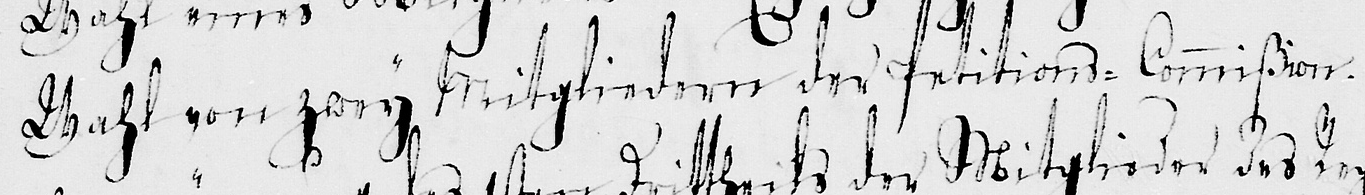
Wahl von zwey Mitgliedern der Petitions-Commißion.
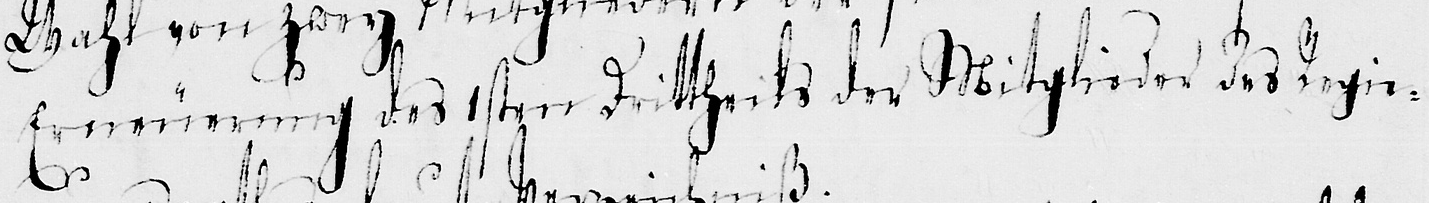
Erneuerung des 1sten Drittheils der Mitglieder des Regie¬
